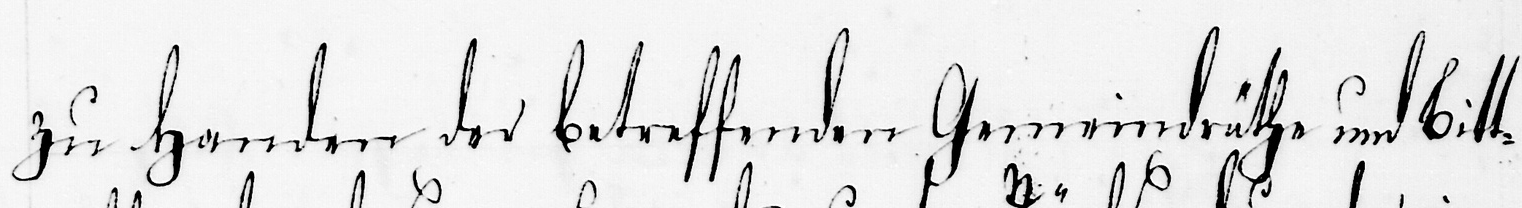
zu Handen der betreffenden Gemeindräthe und
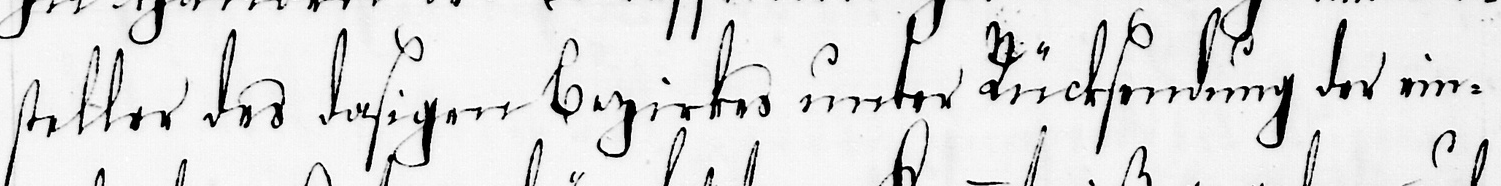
steller des dasigen Bezirkes unter Rücksendung der ein¬
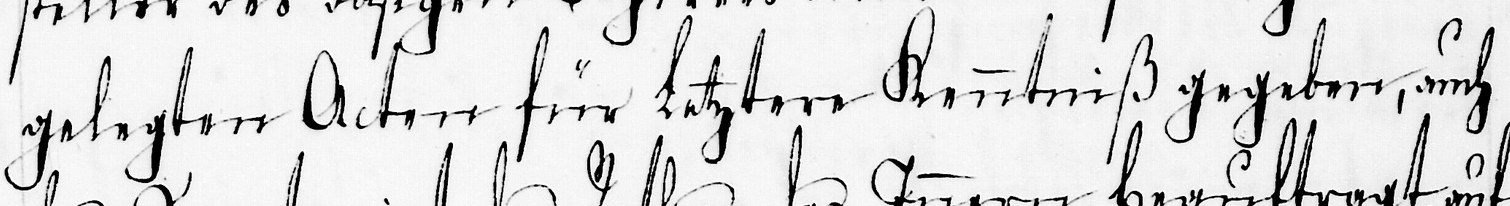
gelegten Acten für Letztere Kenntniß gegeben, auch
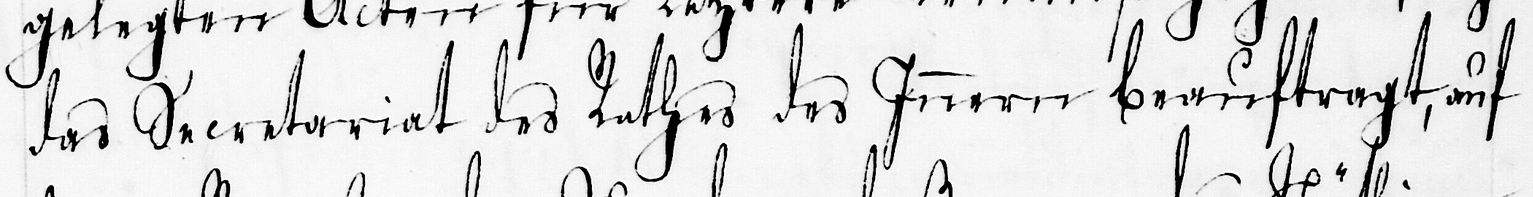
das Secretariat des Rathes des Innern beauftragt, auf
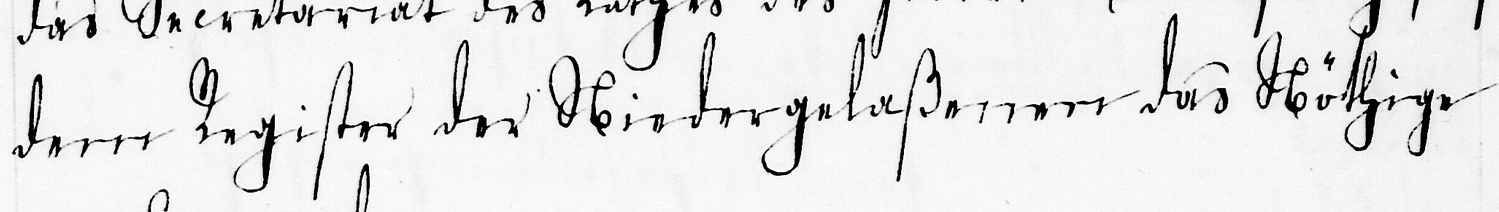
dem Register der Niedergelaßenen das Nöthige
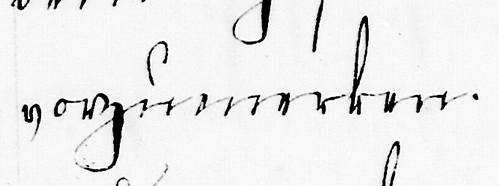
vorzumerken.
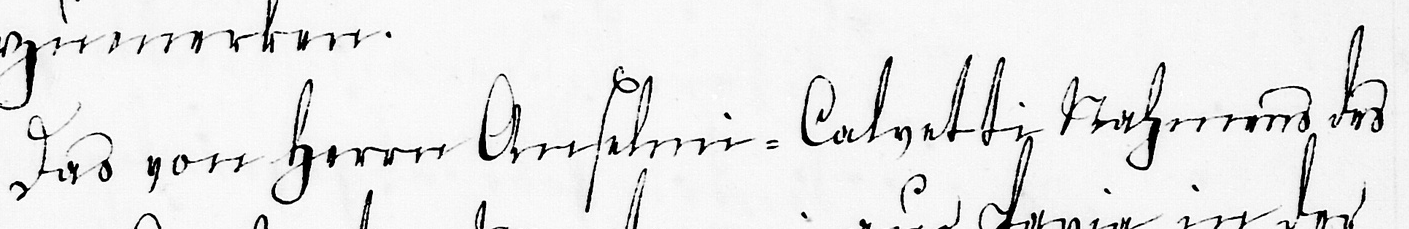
Das von Herrn Anselmi-Calvetti Nahmens des
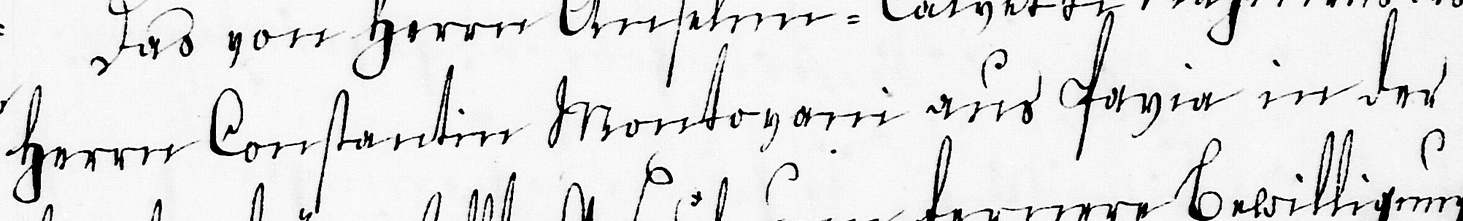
Herrn Constantin Montovani aus Pavia in der
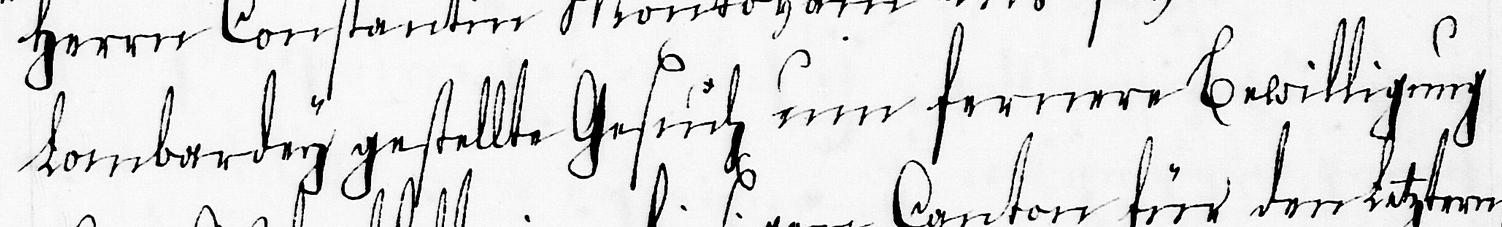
Lombardey gestellte Gesuch um fernere Bewilligung
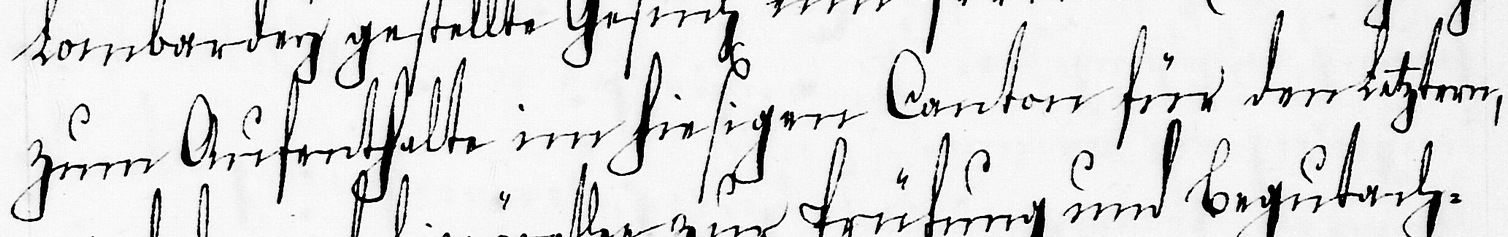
zum Aufenthalte im hiesigen Canton für den Letztern,
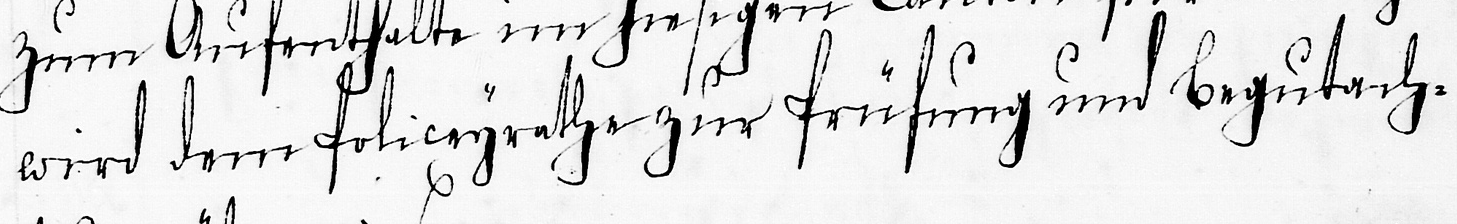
wird dem Policeyrathe zur Prüfung und Begutach¬
